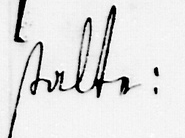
stalte:
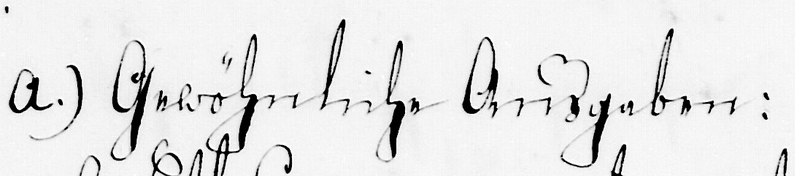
A.) Gewöhnliche Ausgaben:
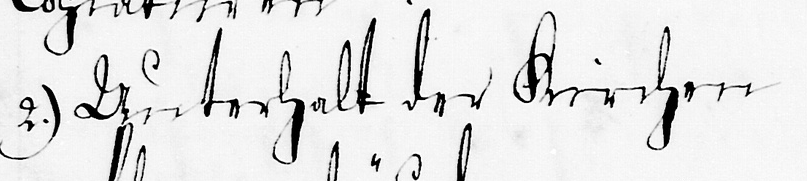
2.) Unterhalt der Kirchen
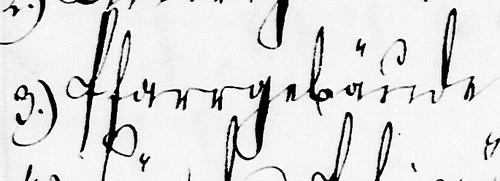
Pfarrgebäud¬
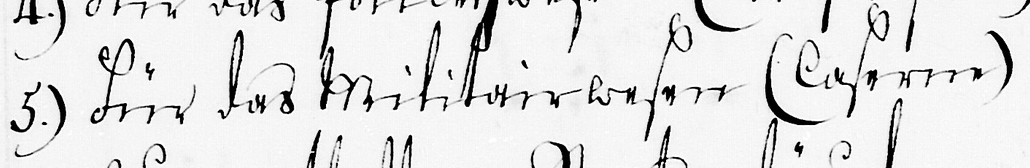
5.) Für das Militairwesen (Casern¬
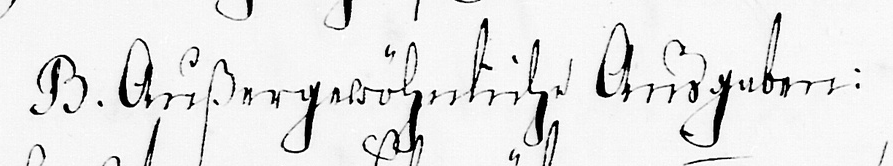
B. Außergewöhnliche Ausgaben:
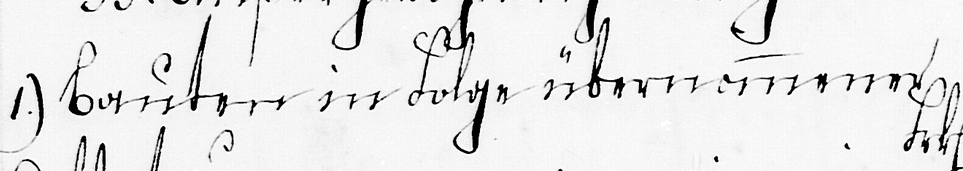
1.) Bauten in Folge übernommener
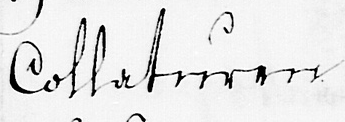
Collaturen
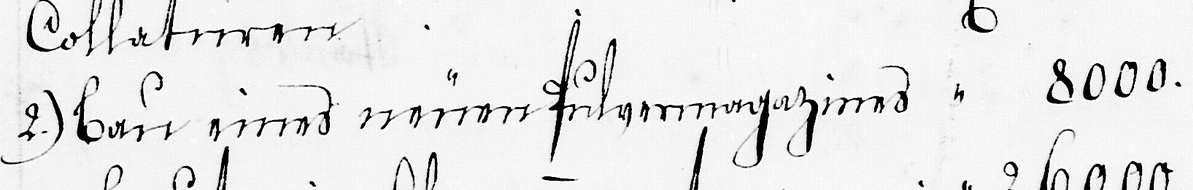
2.) Bau eines neuen Pulvermagazines “ 8000.
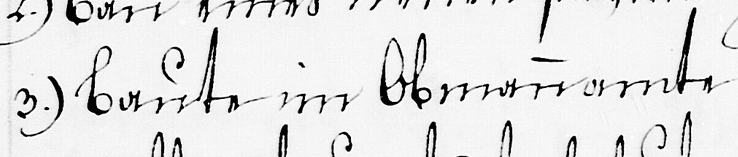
3.) Baute im Obmannamt¬
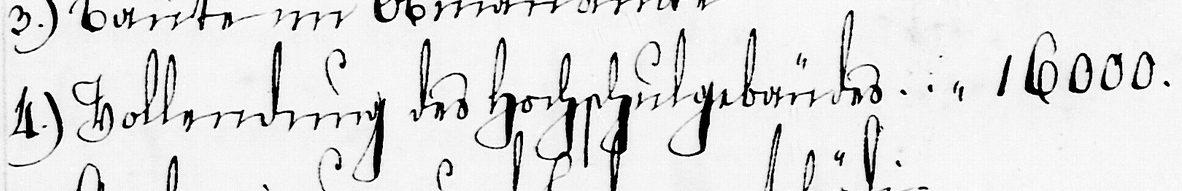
4.) Vollendung des Hochschulgebäudes “ 16 000.
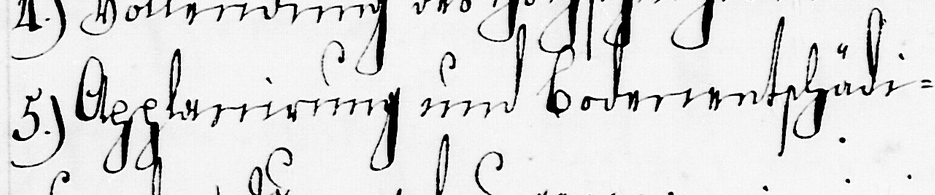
5.) Applanirung und Bodenentschädi¬
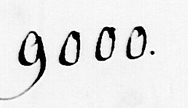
000.
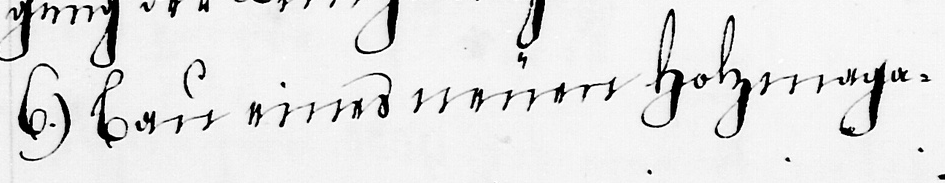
6.) Bau eines neuen Holzmaga¬
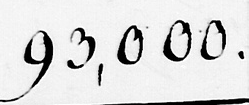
93,000.
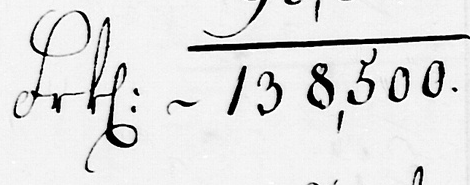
Frk[en]. 138,500.
